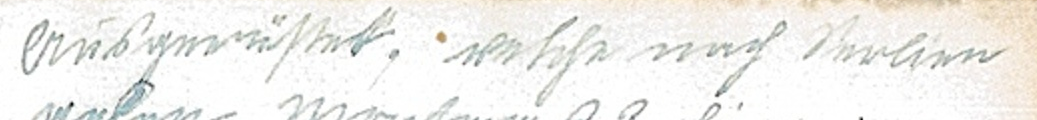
ausgerüstet, welche nach Serbien
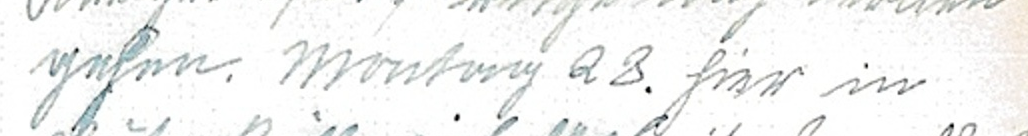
gehen. Montag 28. Hier in
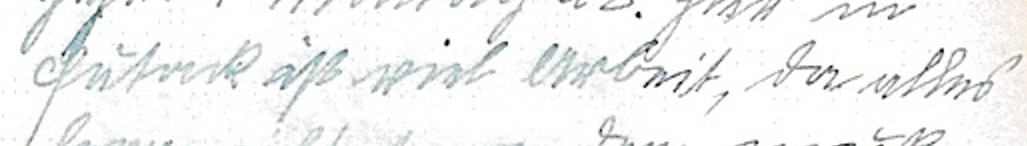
Futok ist viel Arbeit da alles
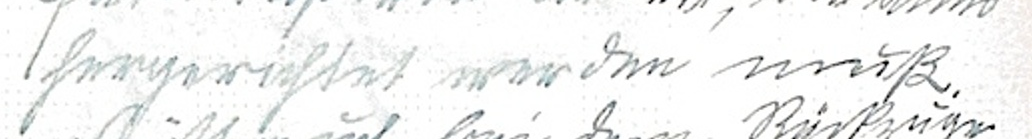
hergerichtet werden muß.
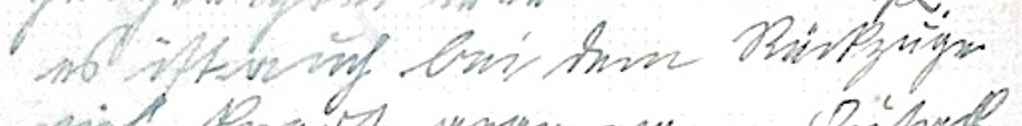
es ist auch bei dem Rüstzeuge
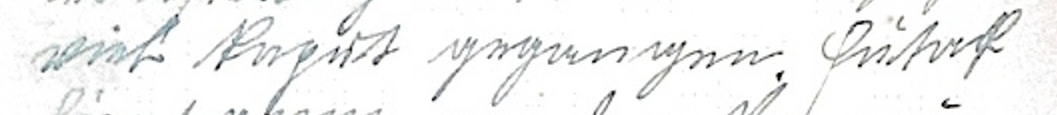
viel kaputt gegangen. Futok
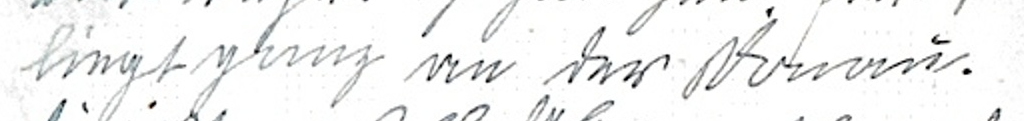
liegt ganz an der Donau.
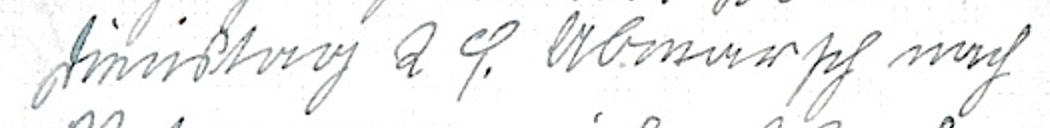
Dienstag 29. Abmarsch nach
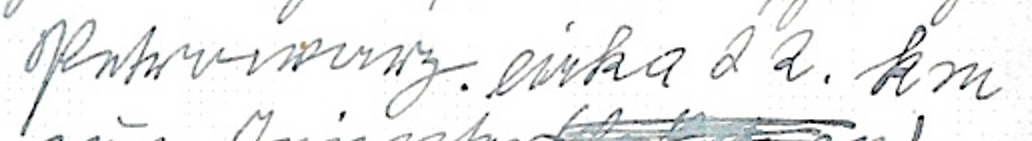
Petrowararz. cirka 2.2 km
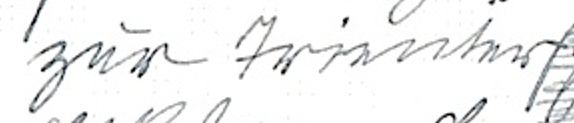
zur Trienter
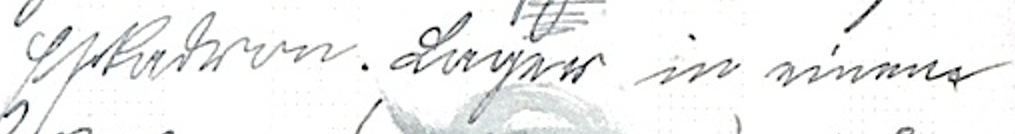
Eskadron. Lager in einem
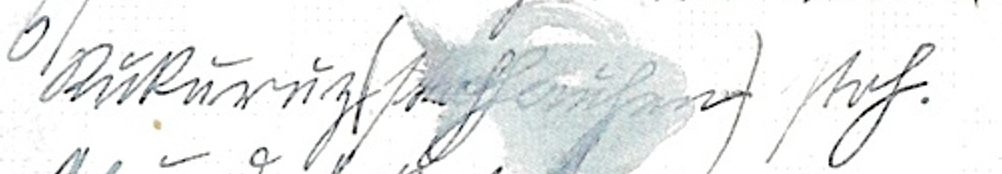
Kukuruz (Strohhaufen) Stroh
